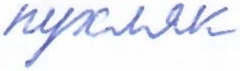пухляк
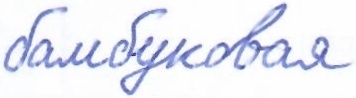бамбуковая
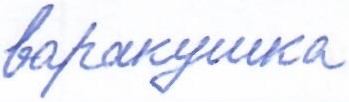варакушка
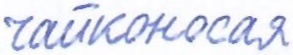чайконосая
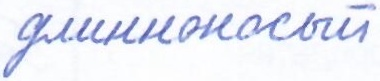длинноносый
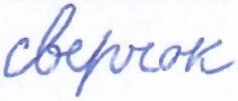сверчок
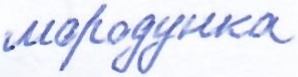мородунка
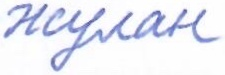жулан
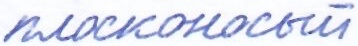плосконосый
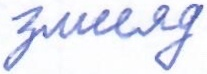змееяд
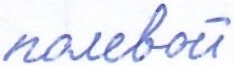полевой
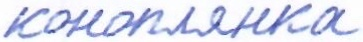коноплянка
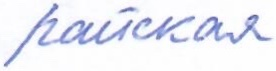райская
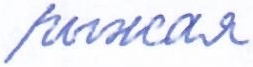рыжая
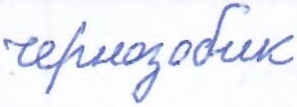чернозобик
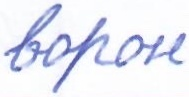ворон
